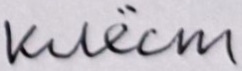клёст
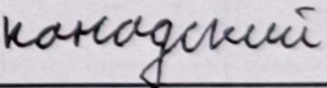канадский
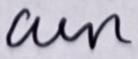сип
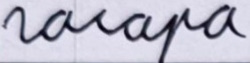гагара
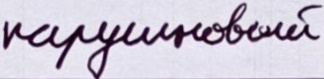парусиновый
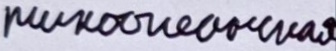тихоокеанская
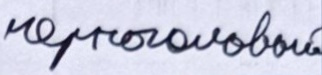черноголовый
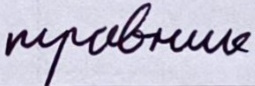травник
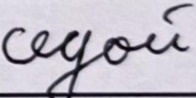седой
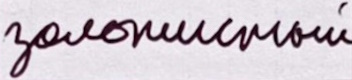золотистый
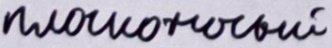плосконосый
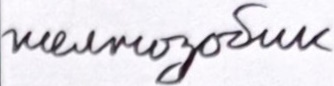желтозобик
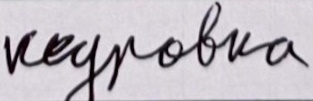кедровка
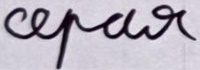серая
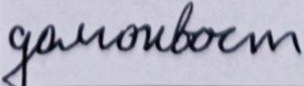долгохвост
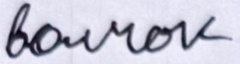волчок
